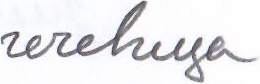чечевица
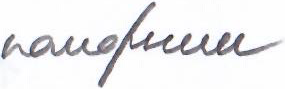поморник
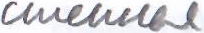степная
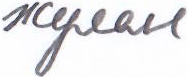жулан
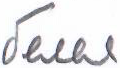белая
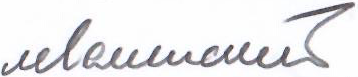левантский
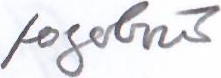розовый
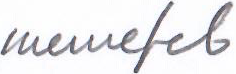тетерев
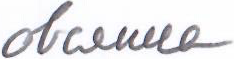овсянка
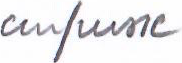стриж
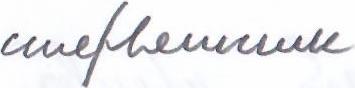стервятник
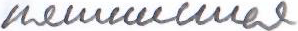пятнистая
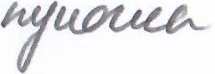пуночка
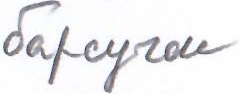барсучок
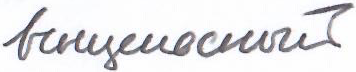венценосный
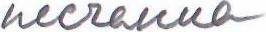песчанка
